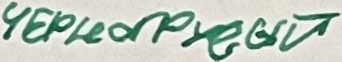черногрудый
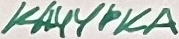качурка
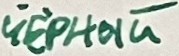чёрный
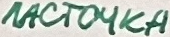ласточка
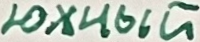южный
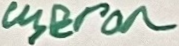щегол
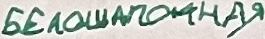белошапочная
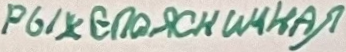рыжепоясничная
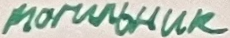могильник
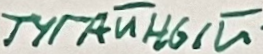тугайный
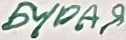бурая
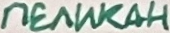пеликан
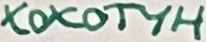хохотун
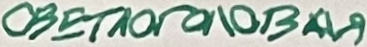светлоголовая
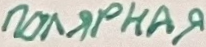полярная
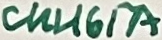синьга
